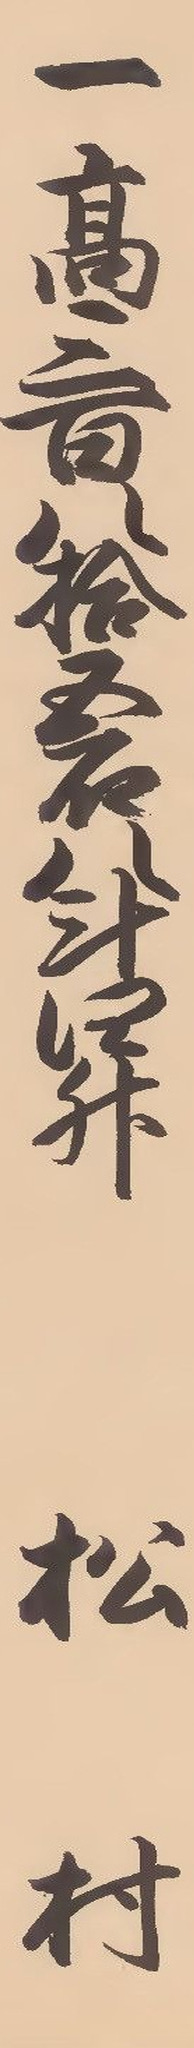一高三百八拾五石八斗四升松村
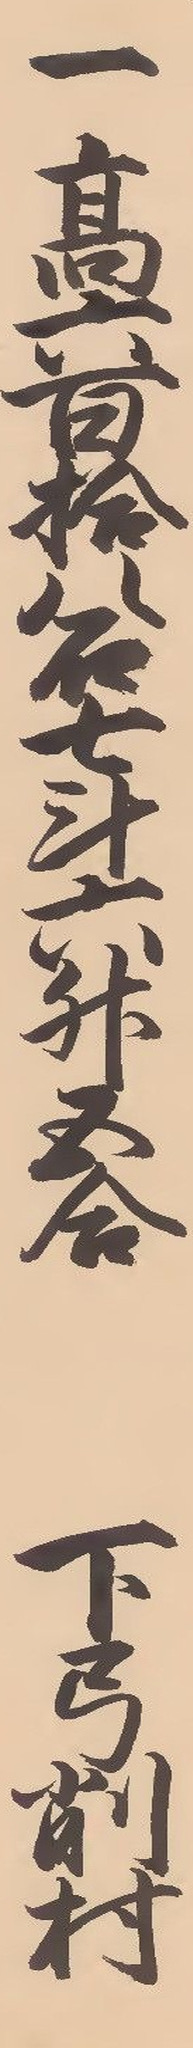一高六百拾八石七斗六升五合下弓削村
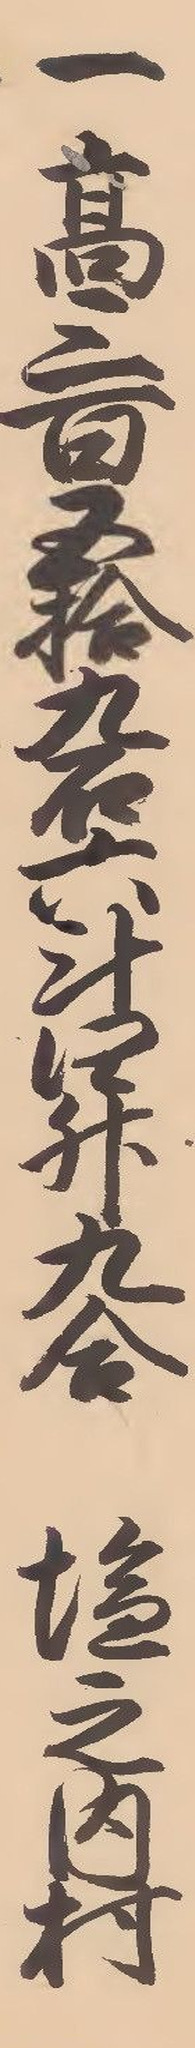一高三百五拾九石六斗四升九合塩之内村

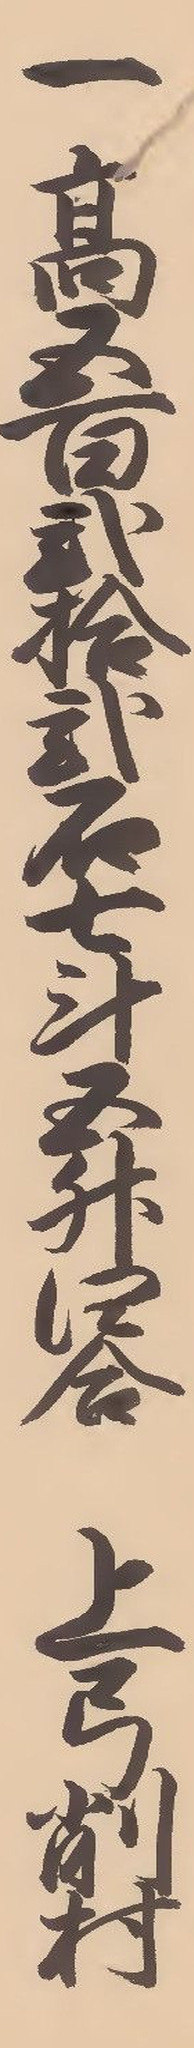一高五百弐拾弐石七斗五升四合上弓削村
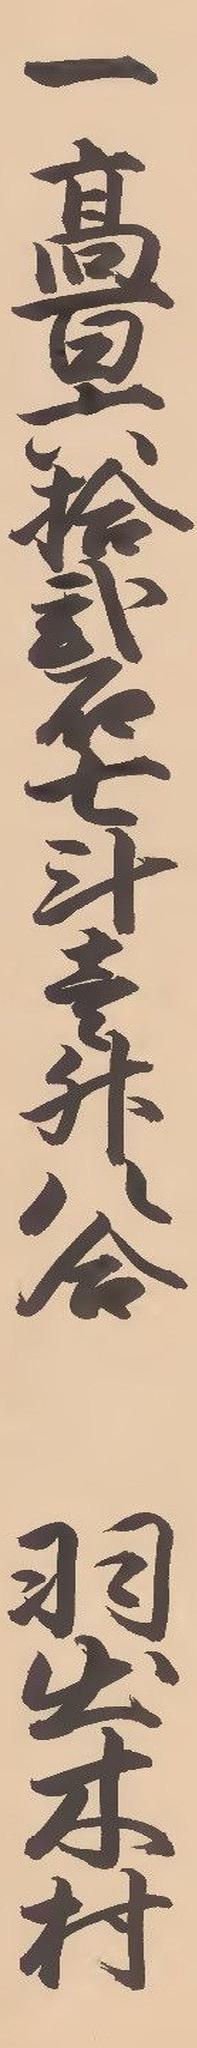一高百六拾弐石七斗壱升八合羽出木村
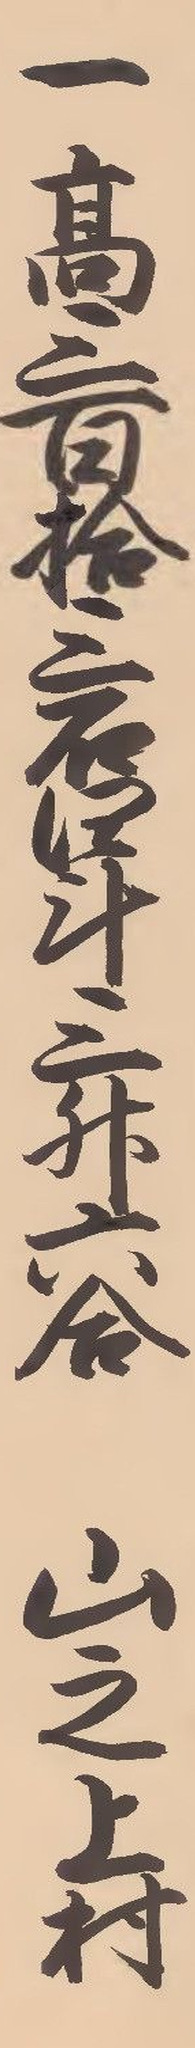一高三百拾三石四斗三升六合山之上村
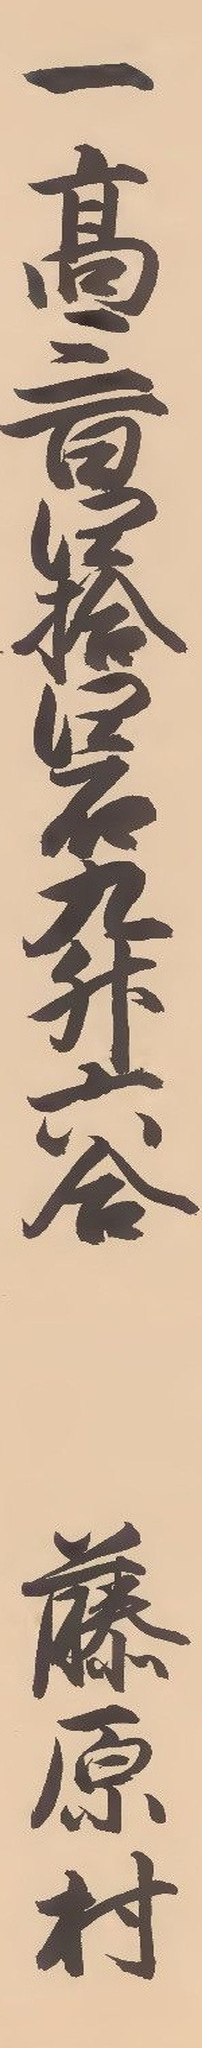一高三百四拾四石九升六合藤原村
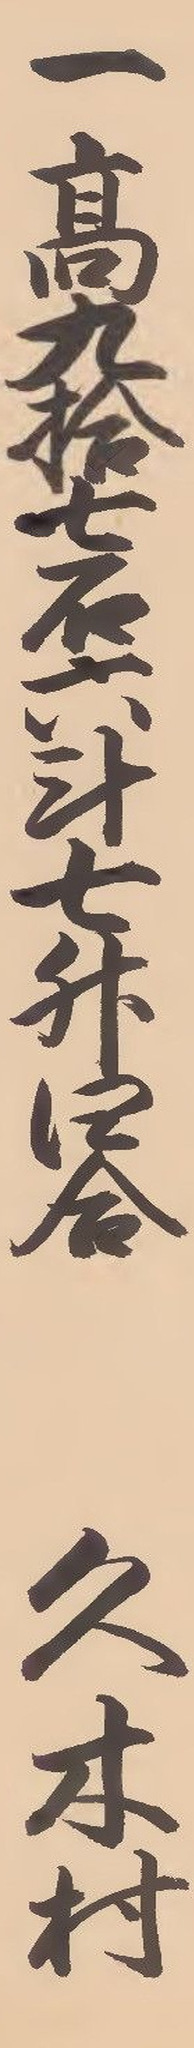一高九拾七石六斗七升四合久木村

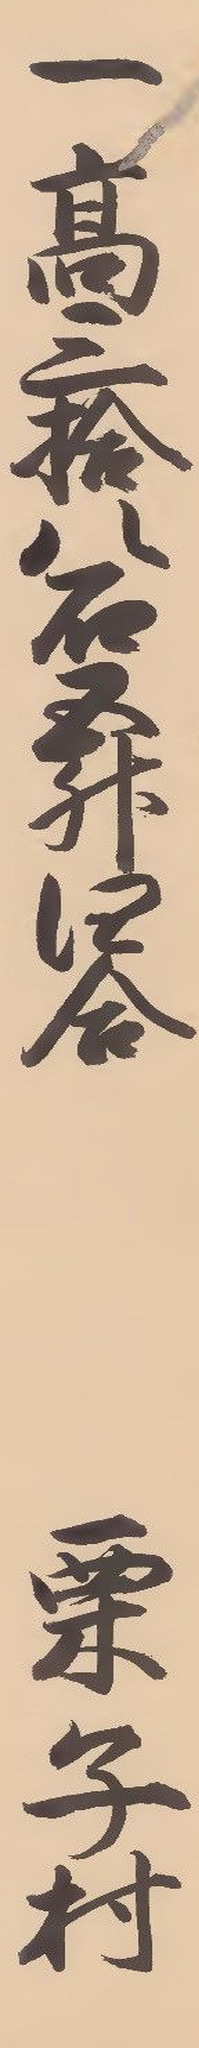一高三拾八石五升四合栗子村
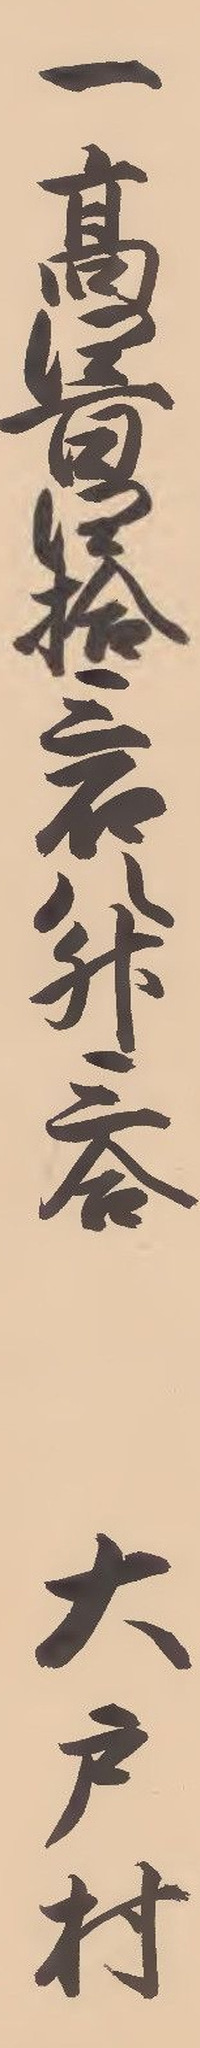一高四百四拾三石八升三合大戸村
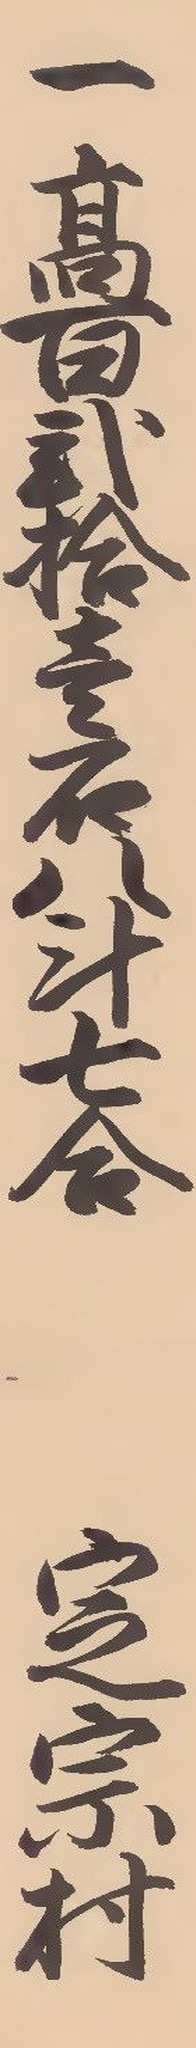一高百弐拾壱石八斗七合定宗村
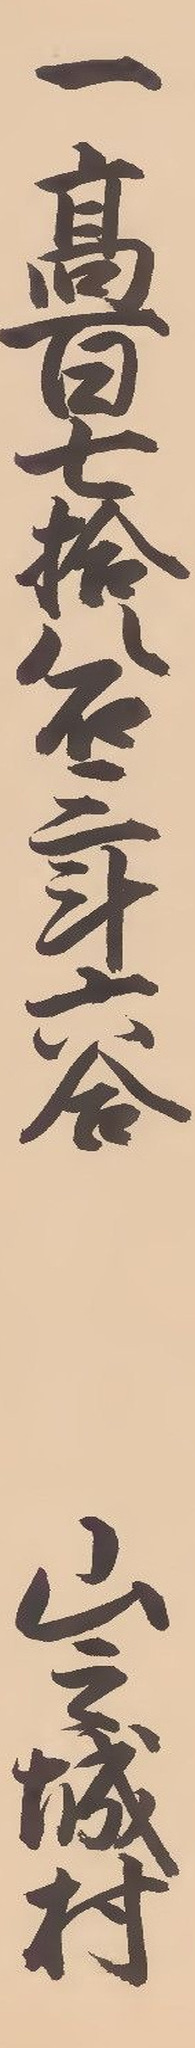一高百七拾八石三斗六合山之城村
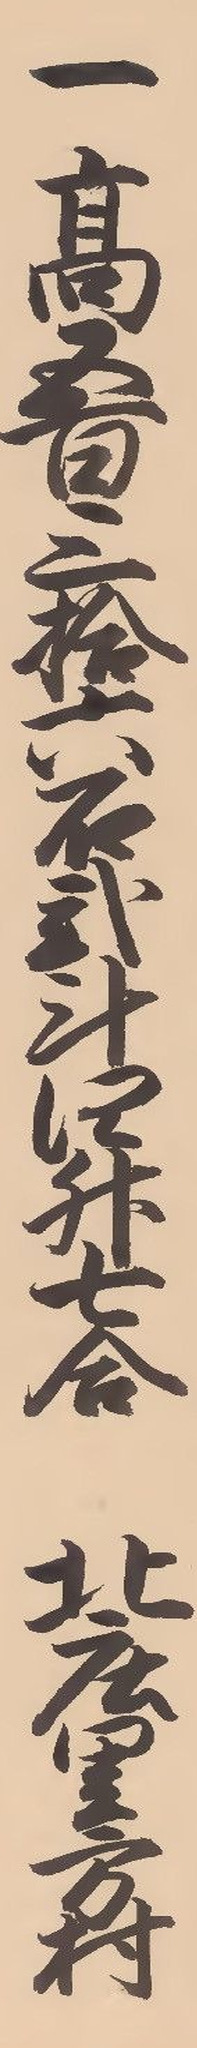一高五百三拾六石弐斗四升七合北庄里方村
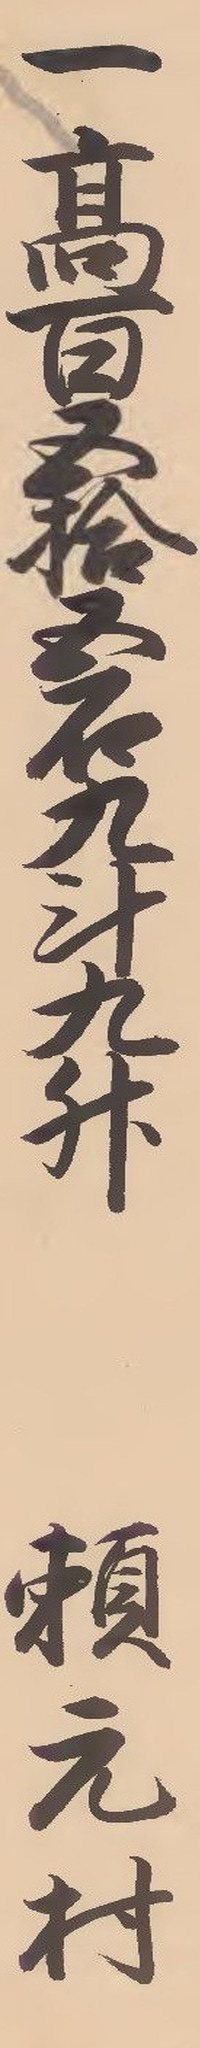一高百五拾五石九斗九升頼元村

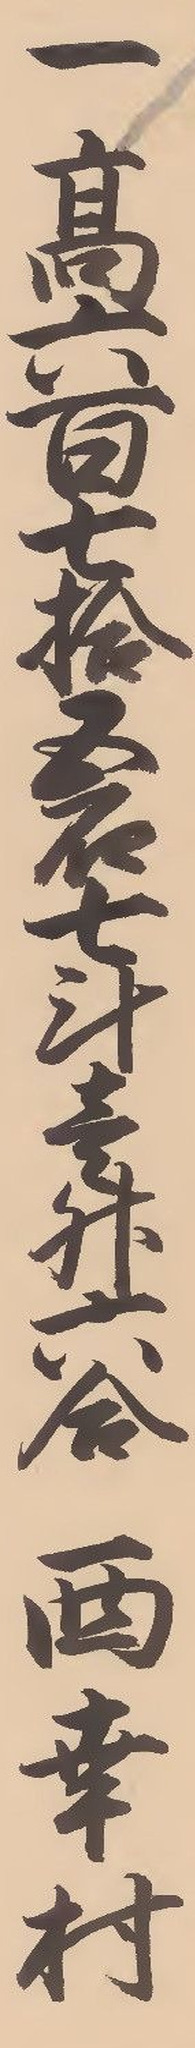一高六百七拾五石七斗壱升六合西幸村
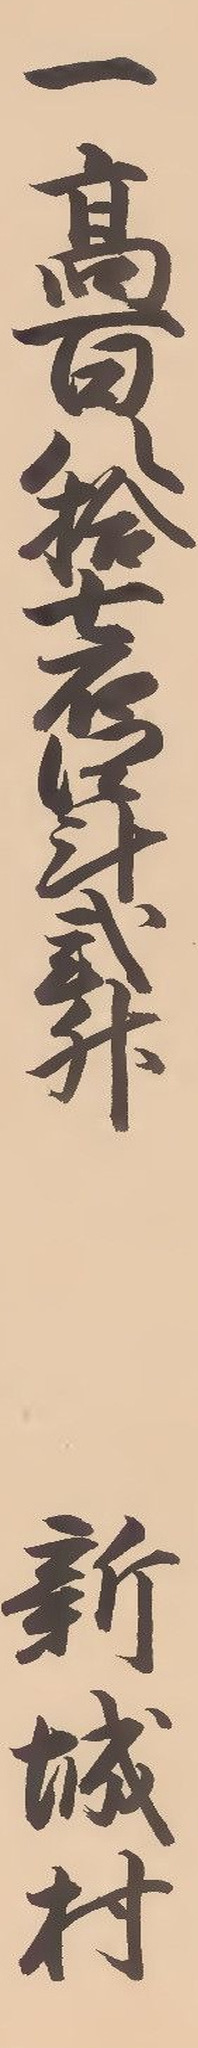一高百八拾七石四斗弐升新城村
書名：美作国郷帳
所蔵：国立公文書館 National Archives of Japan
